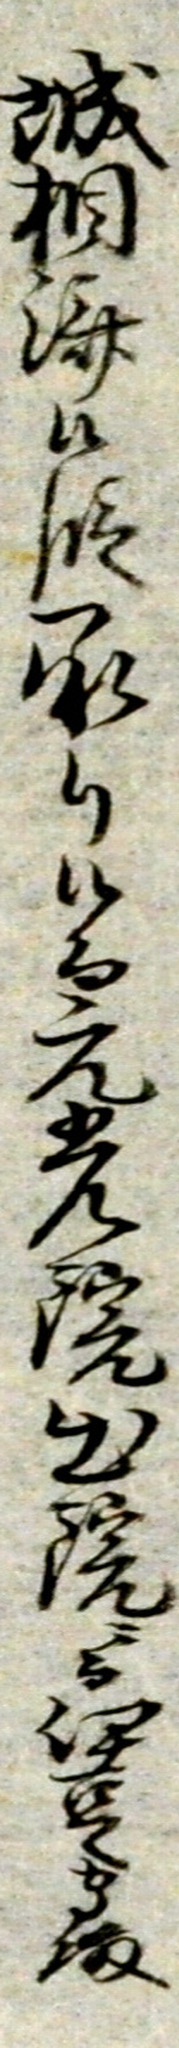城相済候段承り候而元光院出院ニ而伊豆守殿
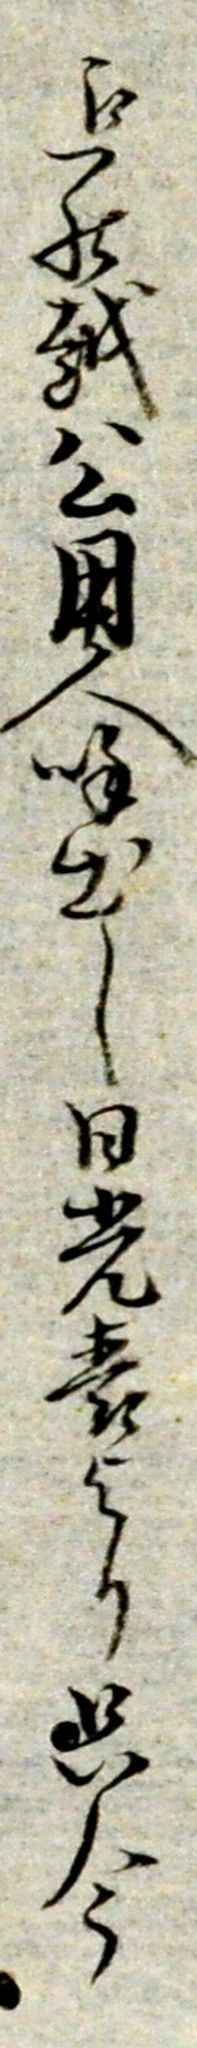江罷越公用人呼出し日光表より只今
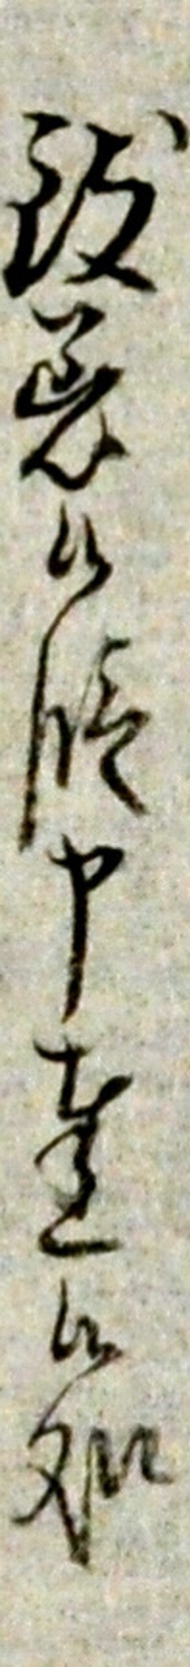致着候段申達候処
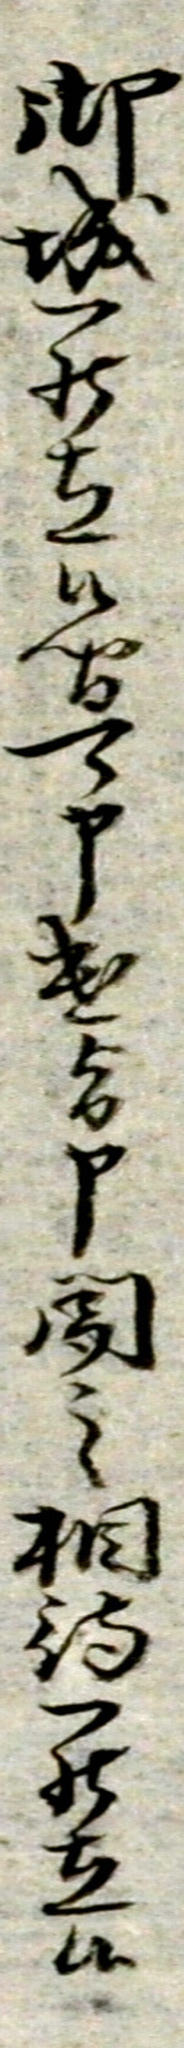御城罷在候間可申遣旨申聞之相待罷在候
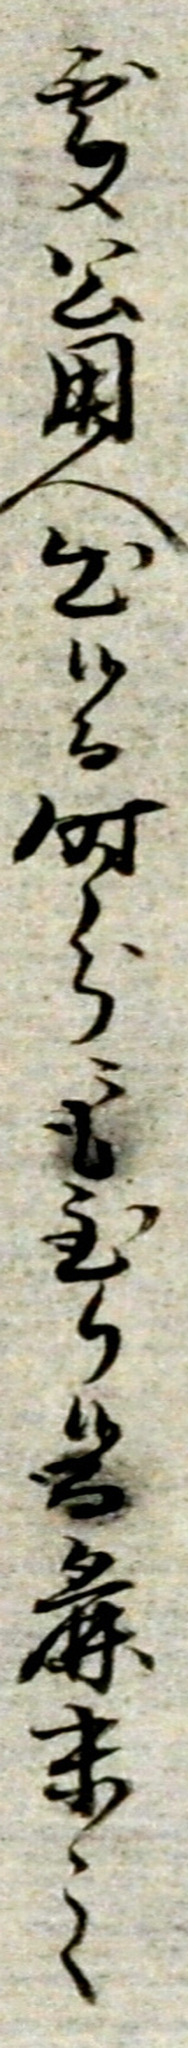処公用人出候而時分ニも至り候而麁末之
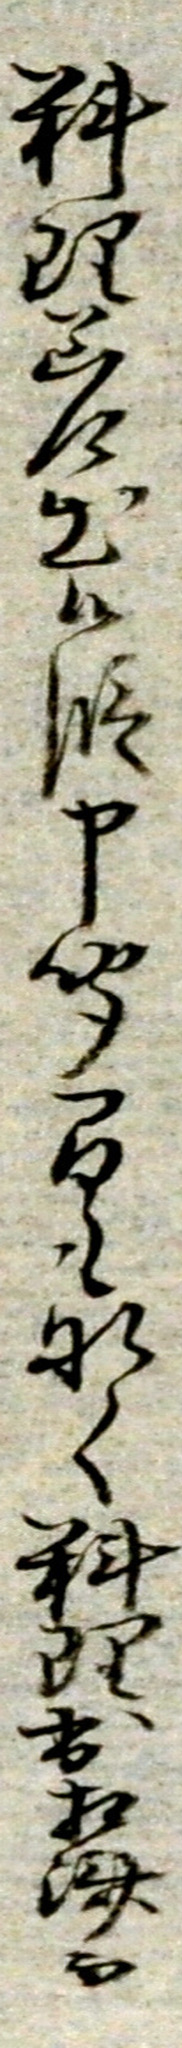料理差出候段申聞間もなく料理出相済而
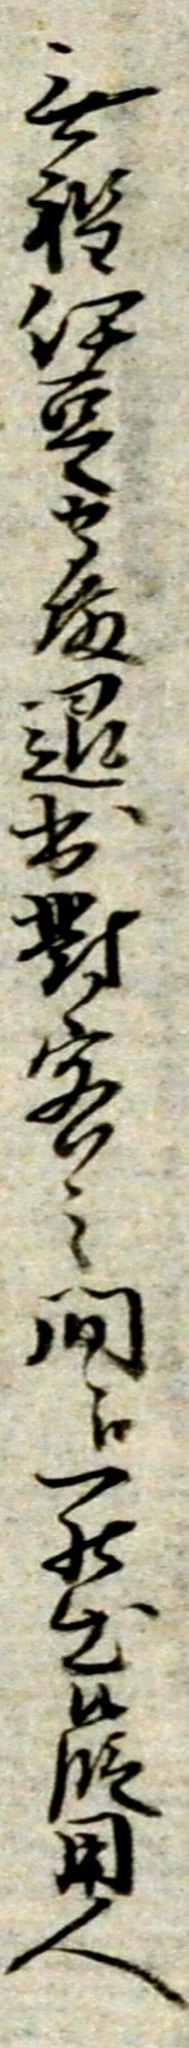無程伊豆守殿退出対客之間江罷出候段用人
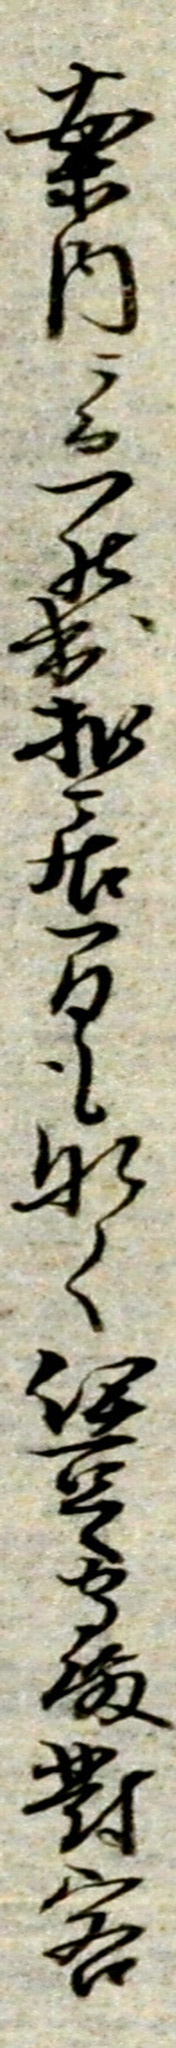案内二而罷出掛扣居間もなく伊豆守殿対客
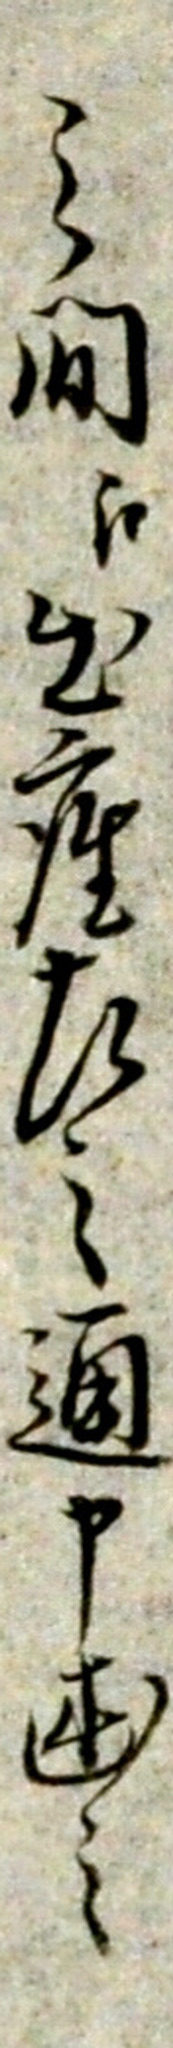之間江出座左之通申述之
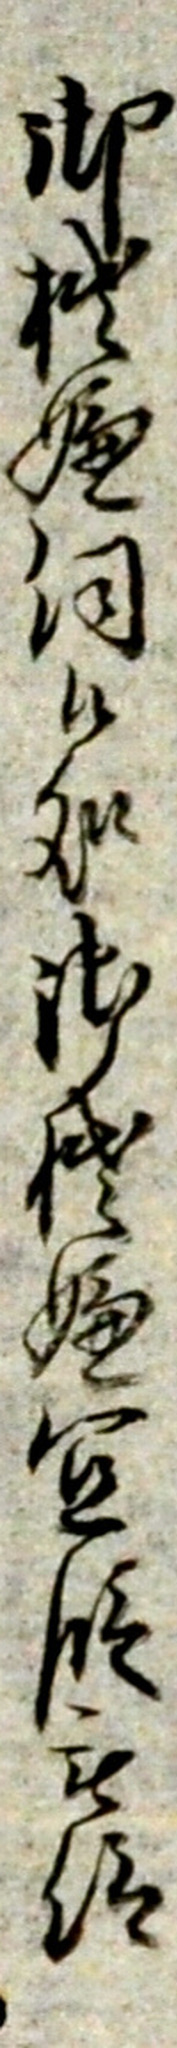御機嫌伺候処御機嫌宜段被仰
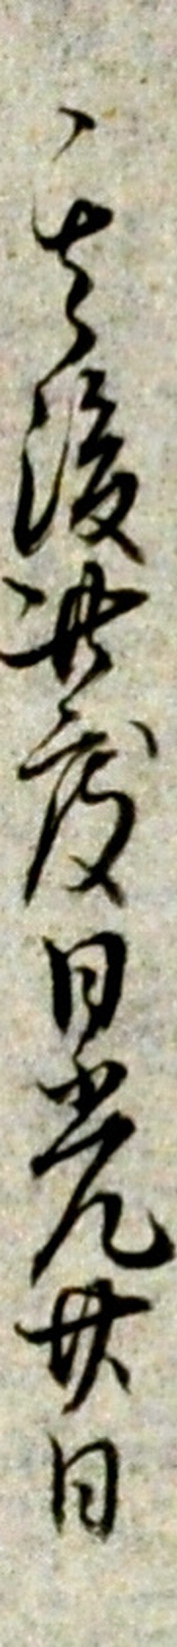其後此度日光廿日
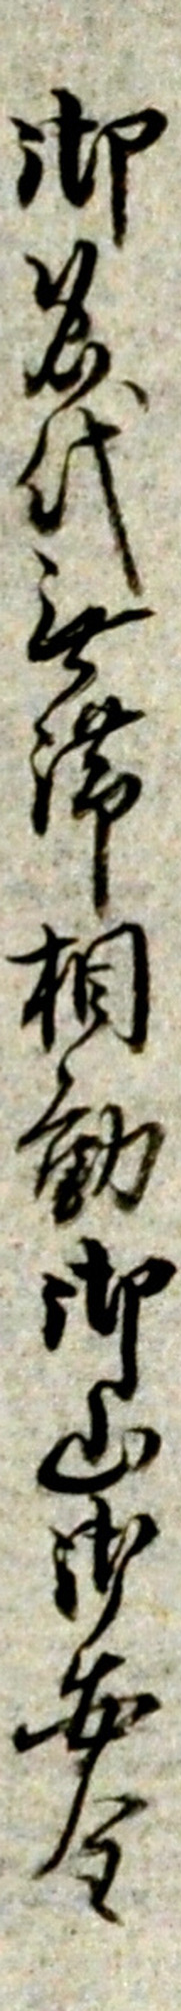御名代無滞相勤御山御安全
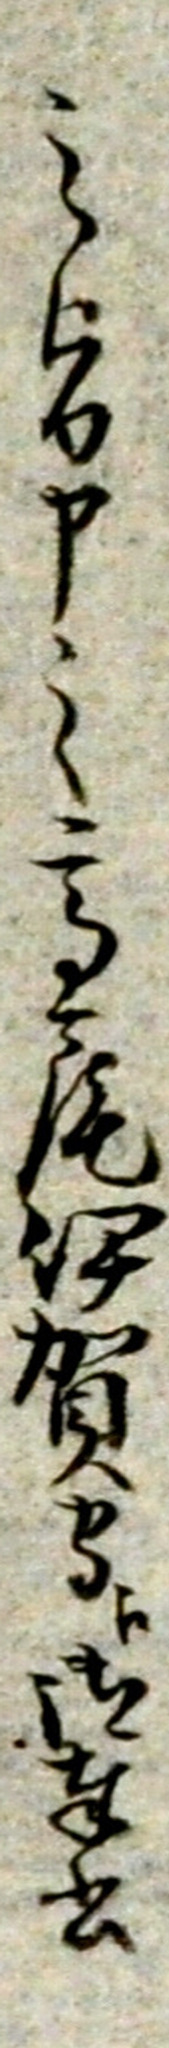之旨申之高尾伊賀守江御奉書
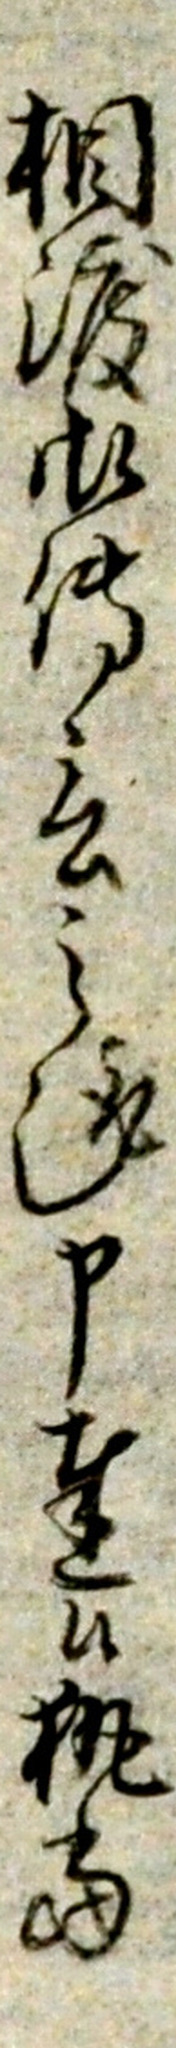相渡御伝言之趣申達候執当
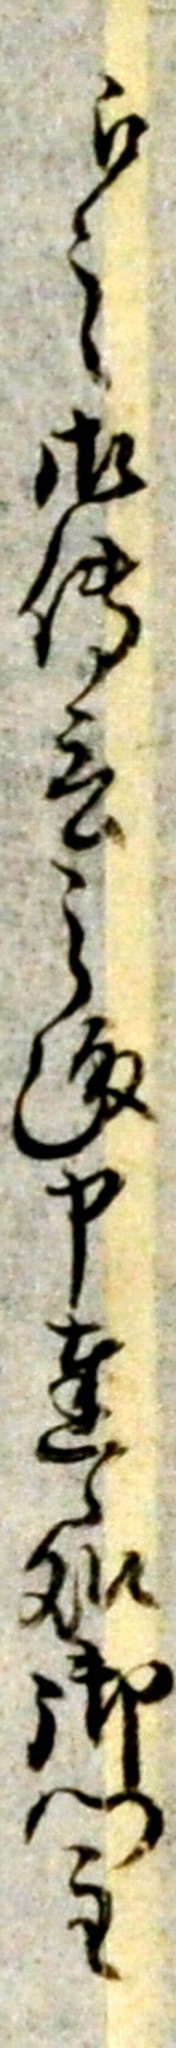江之御伝言之趣申達候処御門主
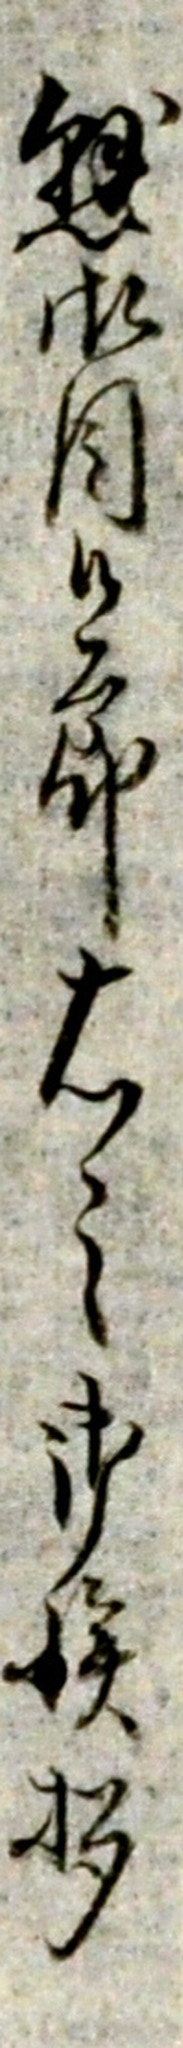懸御目候節右之御挨拶
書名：日光御名代相勤候節ノ留
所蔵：伊那市立高遠町図書館・合同会社AMANE
